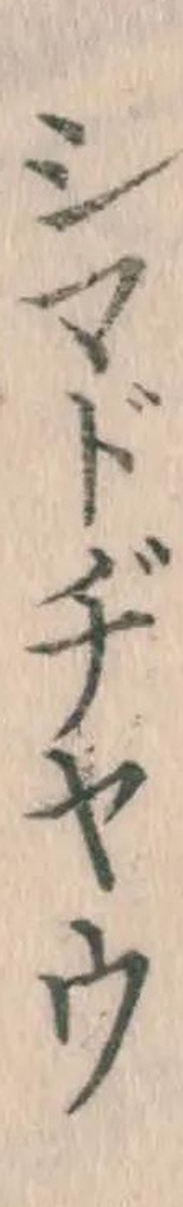シマドヂヤウ
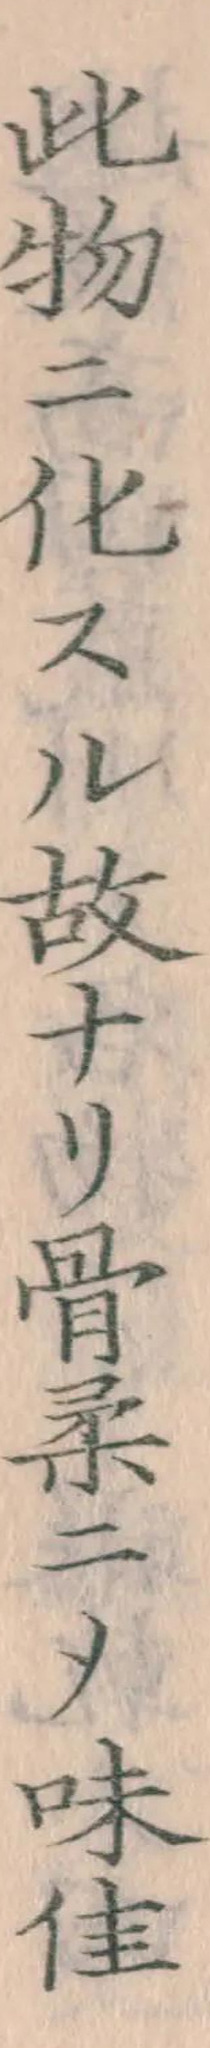此物ニ化スル故ナリ骨柔ニシテ味佳
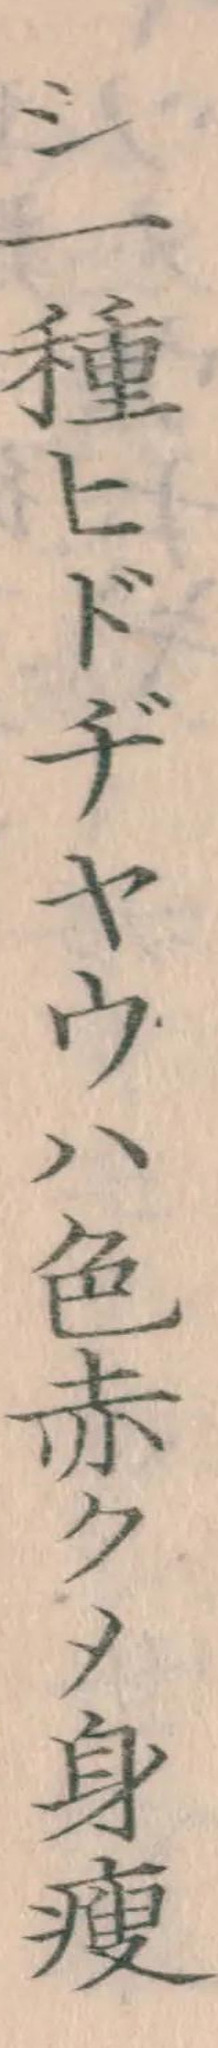シ一種ヒドヂヤウハ色赤クシテ身痩
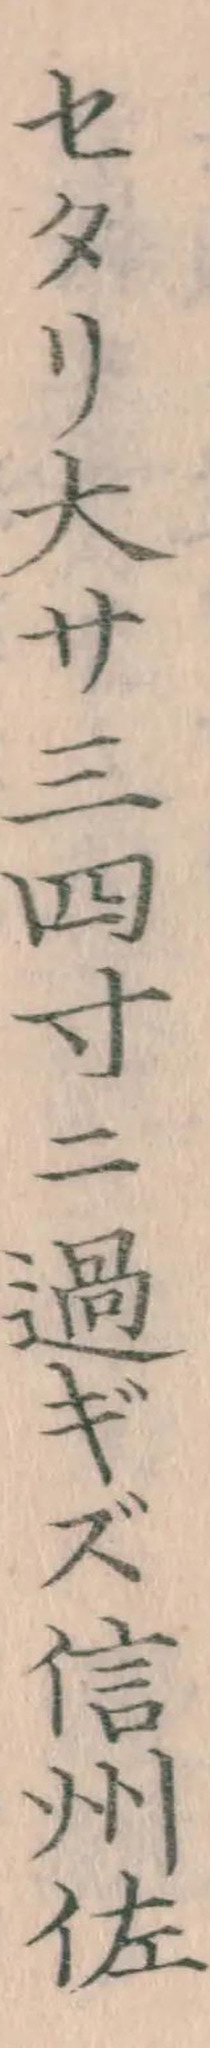セタリ大サ三四寸ニ過ギズ信州佐
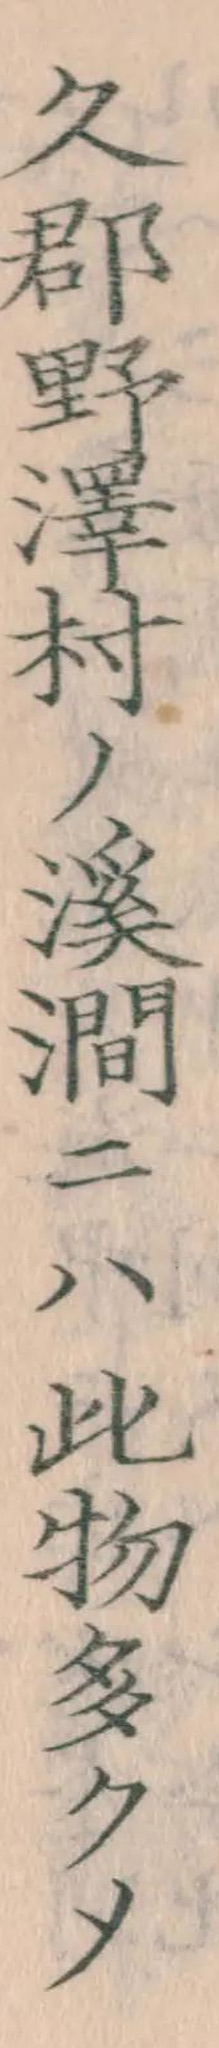久郡野沢村ノ渓澗ニハ此物多クシテ
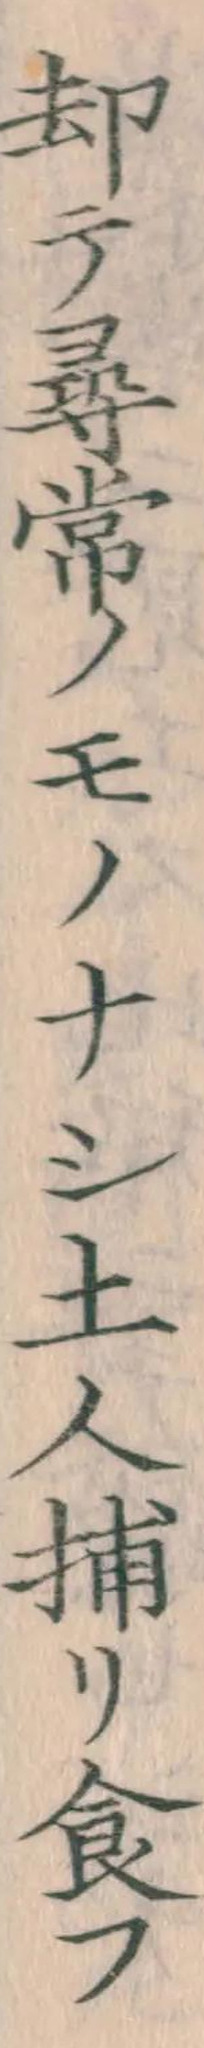却テ尋常ノモノナシ土人捕リ食フ
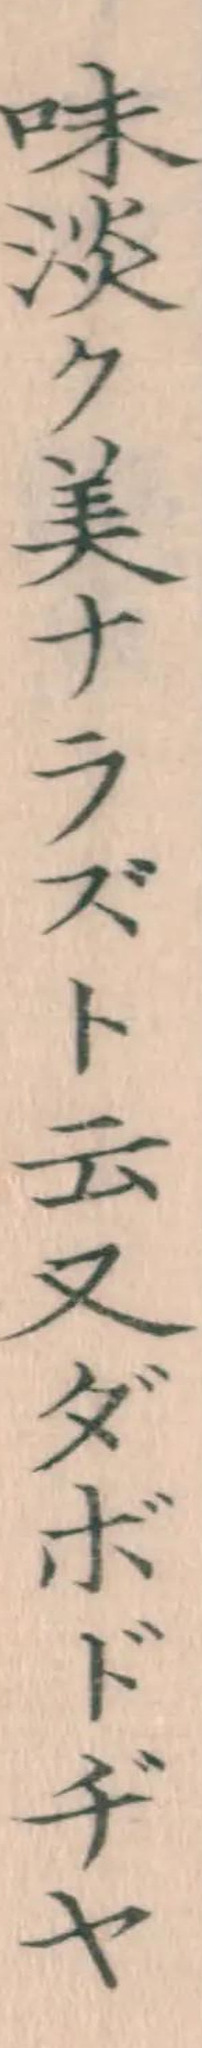味淡ク美ナラズト云又ダボドヂヤ
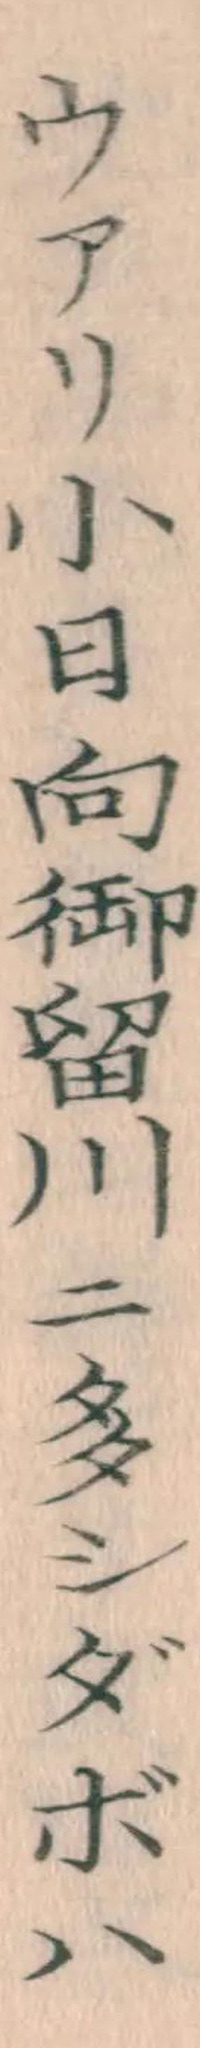ウアリ小日向御留川ニ多シダボハ
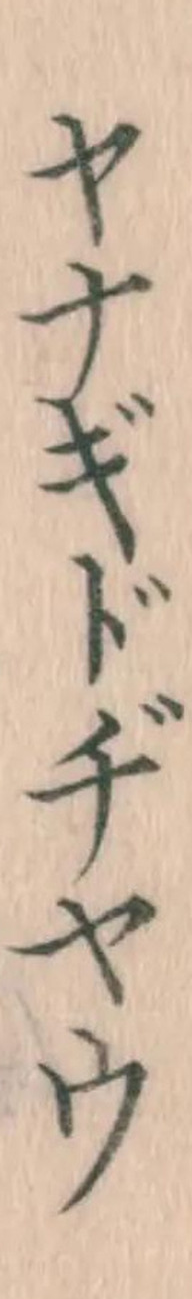ヤナギドヂヤウ
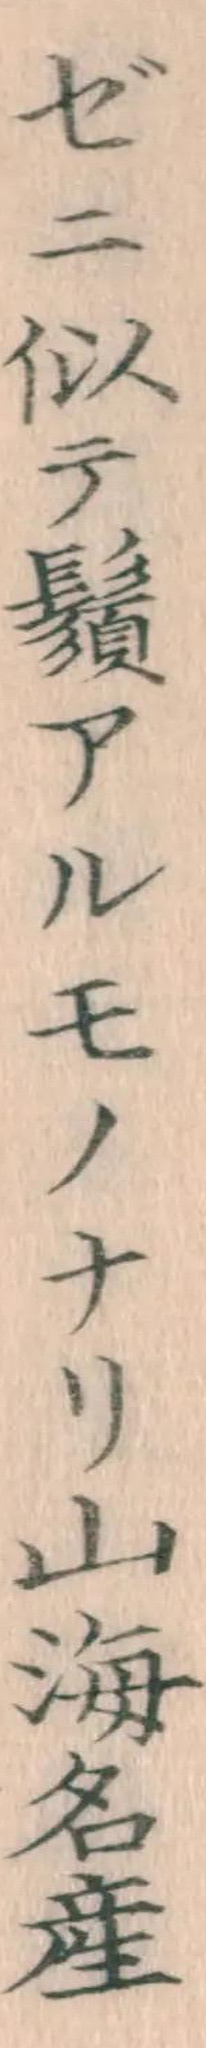ゼニ似テ鬚アルモノナリ山海名産
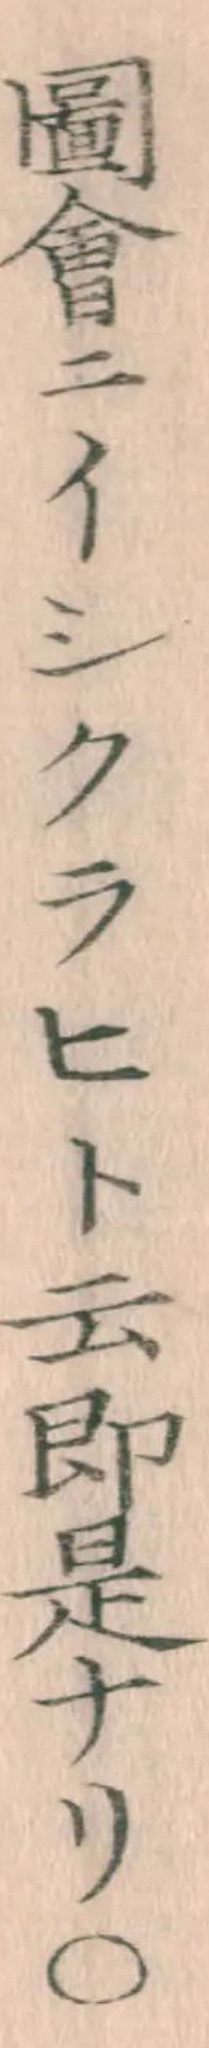図会ニイシクラヒト云即是ナリ〇
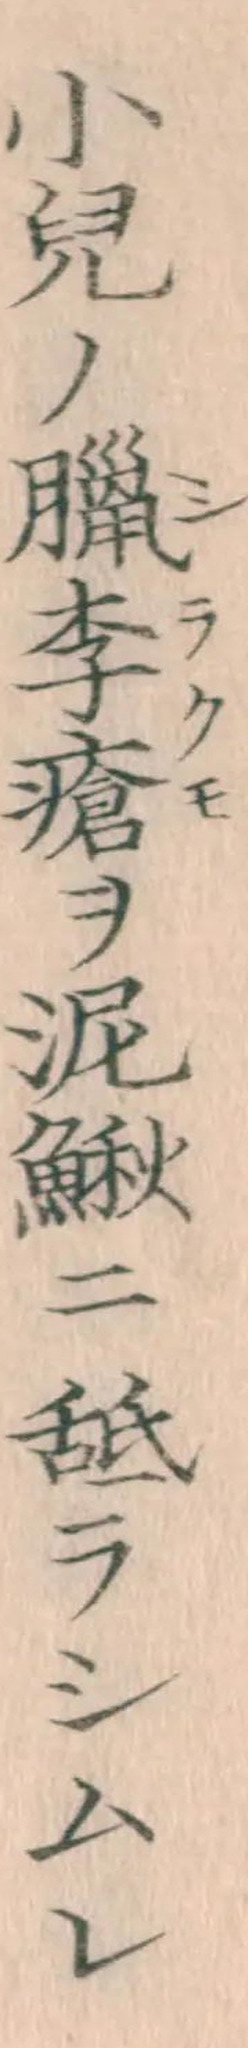小児ノ臘李瘡ヲ泥鰍ニ舐ラシムレ
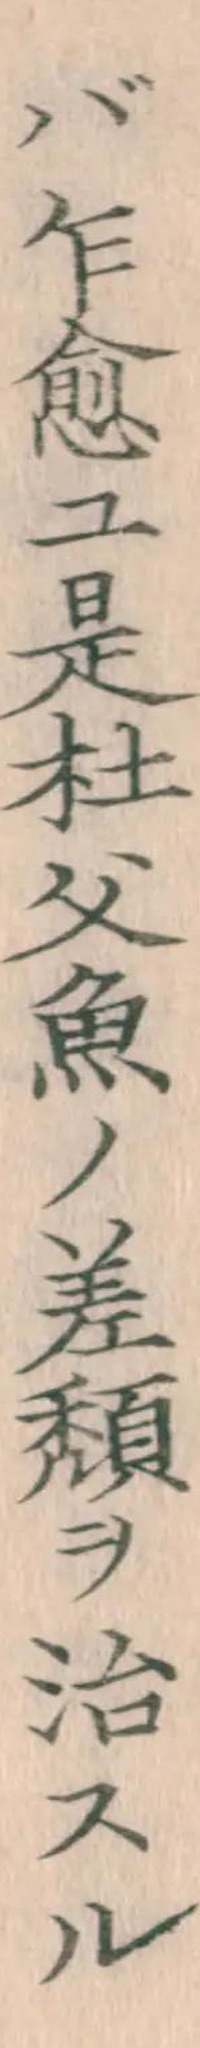バ乍愈ユ是杜父魚ノ差頽ヲ治スル
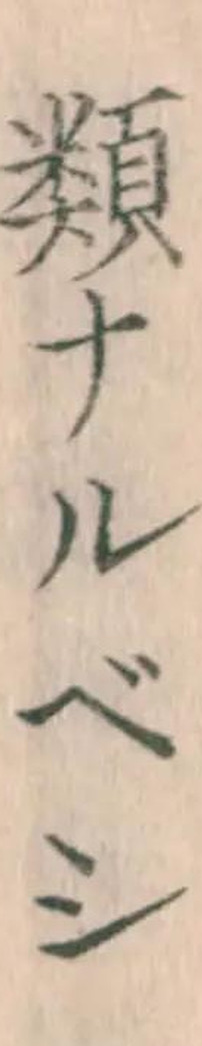類ナルベシ
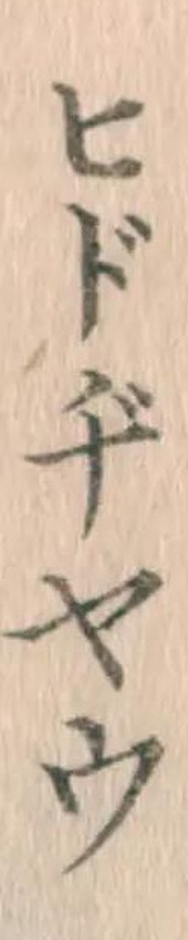ヒドヂヤウ
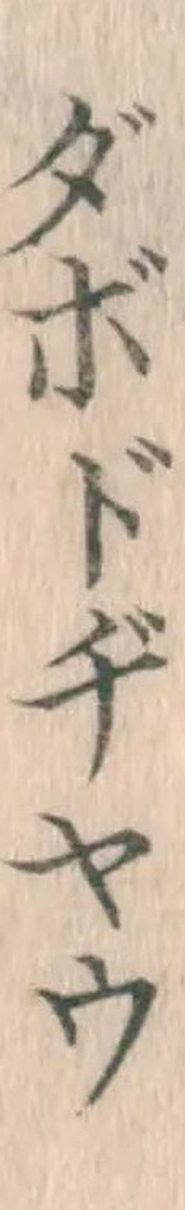ダボドヂヤウ
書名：皇和魚譜 2巻
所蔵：国立国会図書館 National Diet Library, JAPAN
